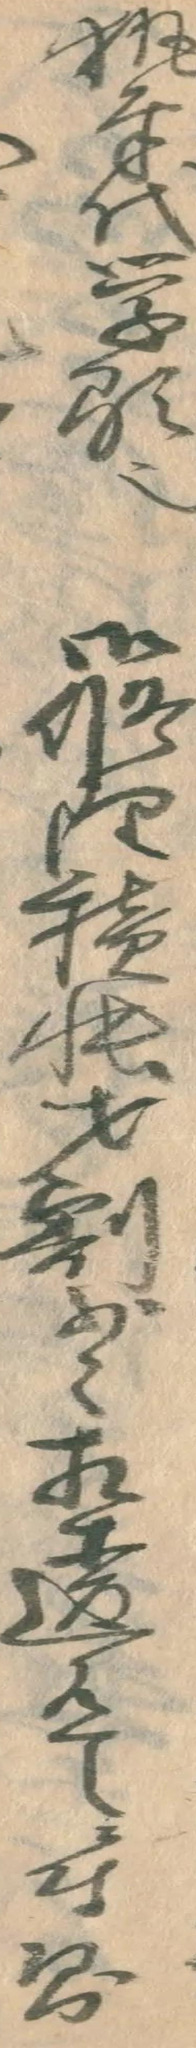執筆代学顕也御修理積帳才割少々相違有之ニ付則

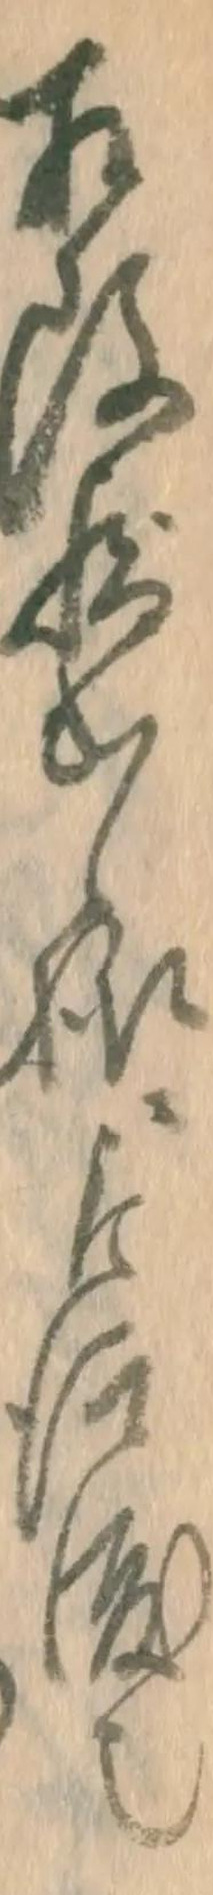相改指出候様ニ被仰渡也
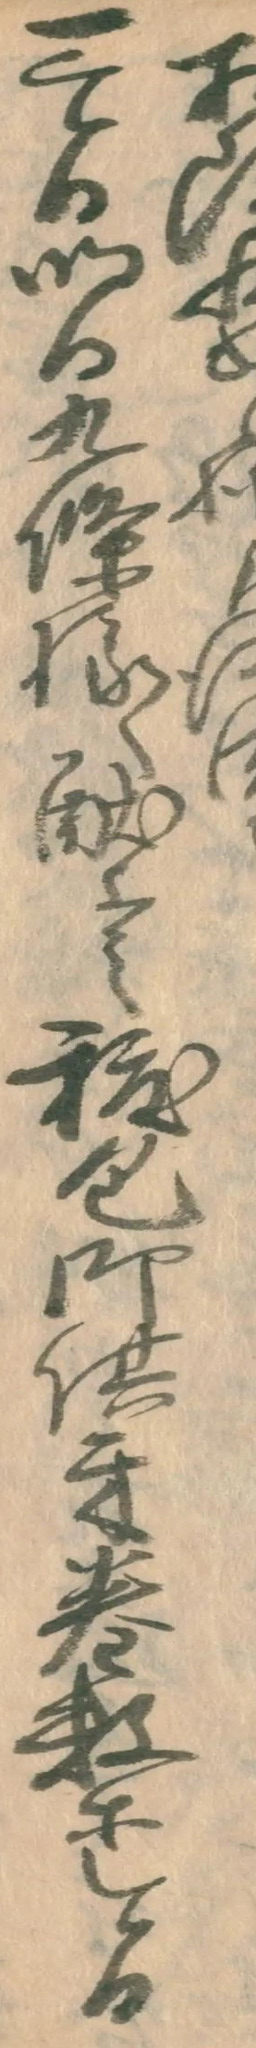一今日明日九条様へ献上之祓包御供米巻数等今日
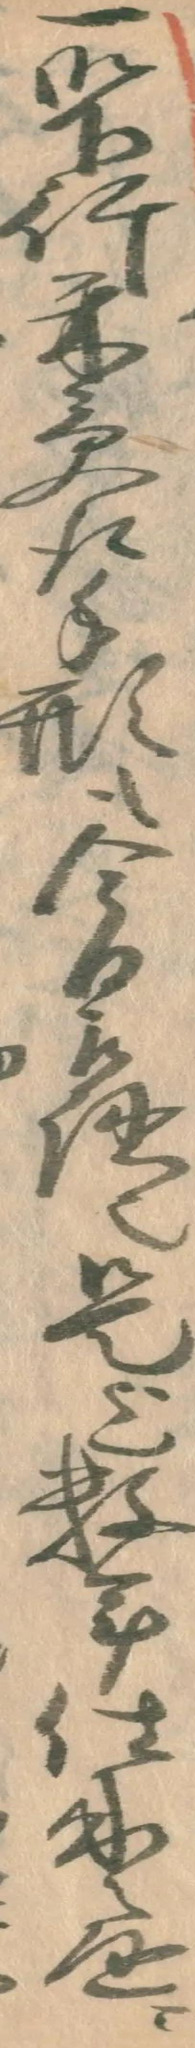一御下行米受取手形も今日被認也是迄数年仕来之通ニ
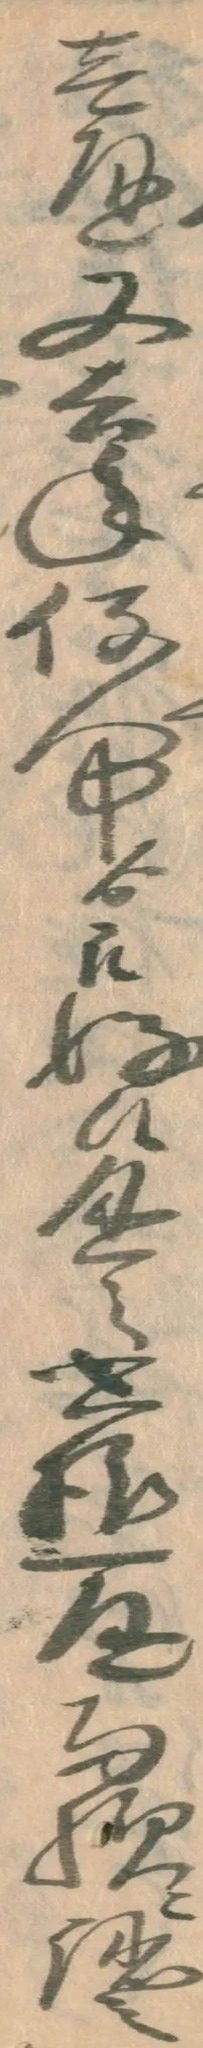壱通又去年役人中ゟ被好候通之書様一通両様ニ認之
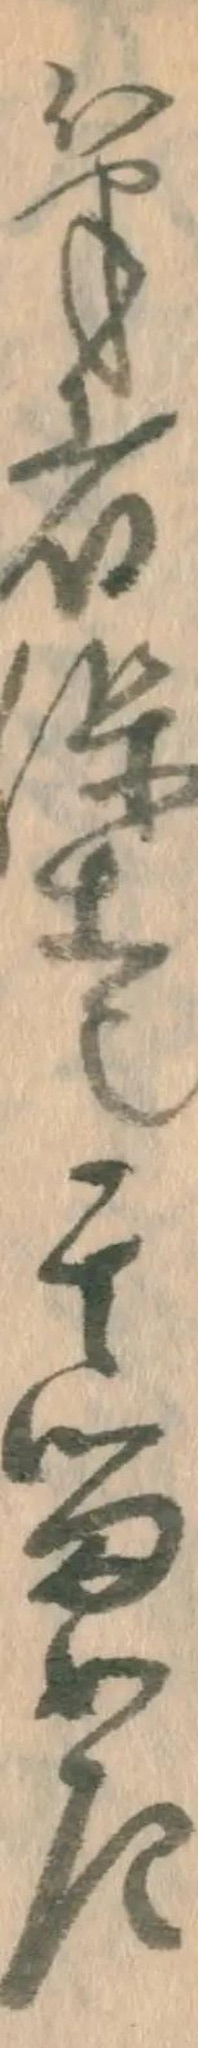筆者保土也其留如左
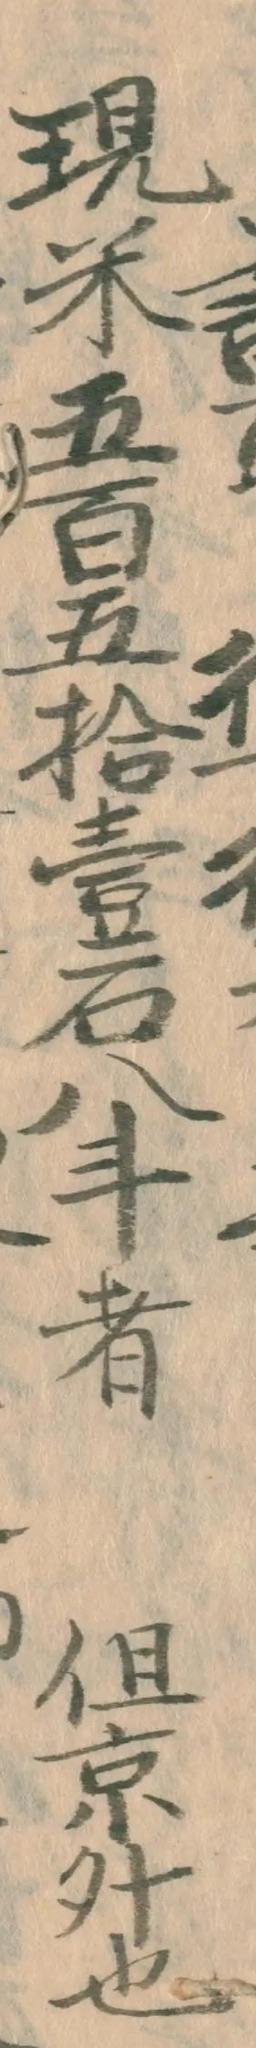現米五百五拾壱石八斗者但京升也
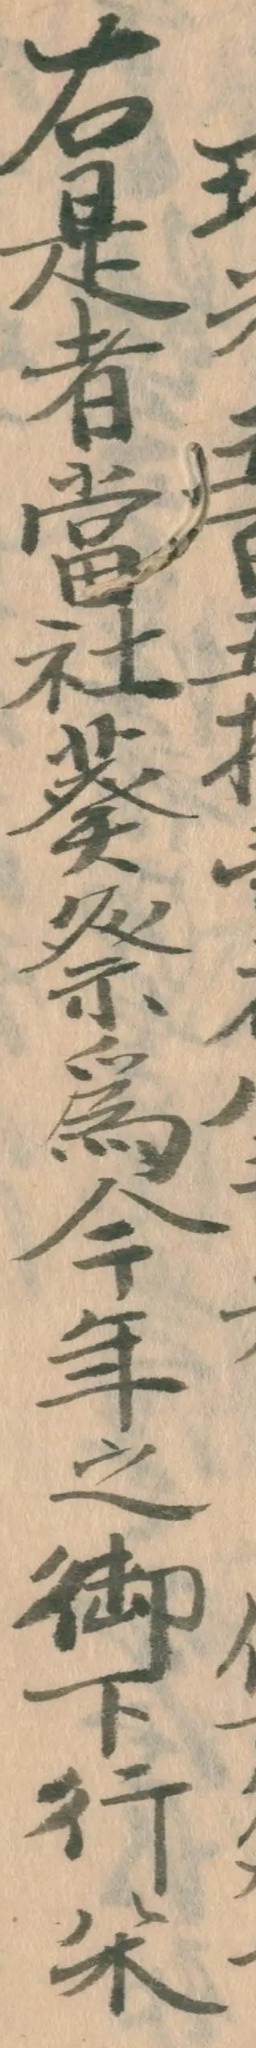右是者当社葵祭爲今年之御下行米
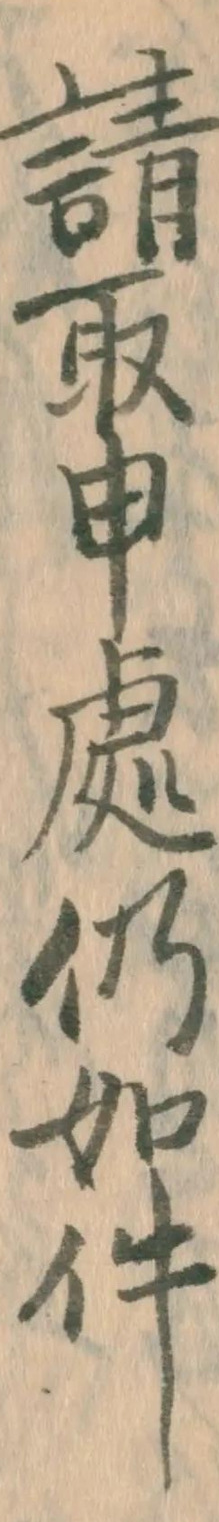請取申処仍如件
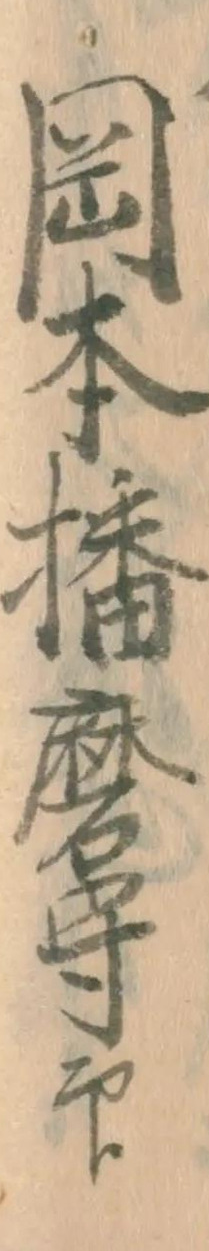岡本播磨守印
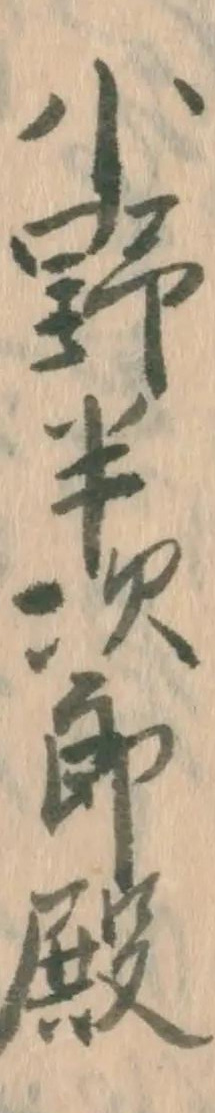小野半次郎殿
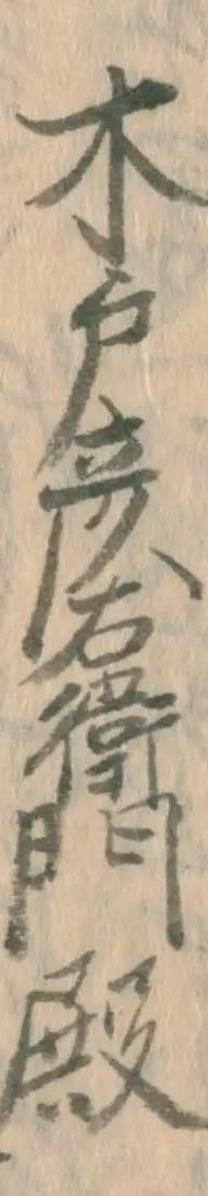木戸彦右衛門殿
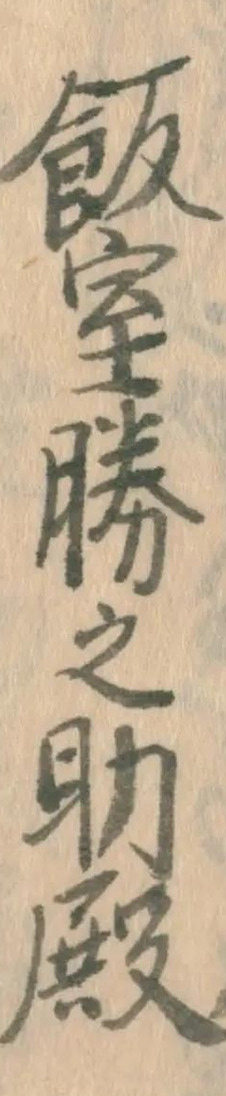飯室勝之助殿
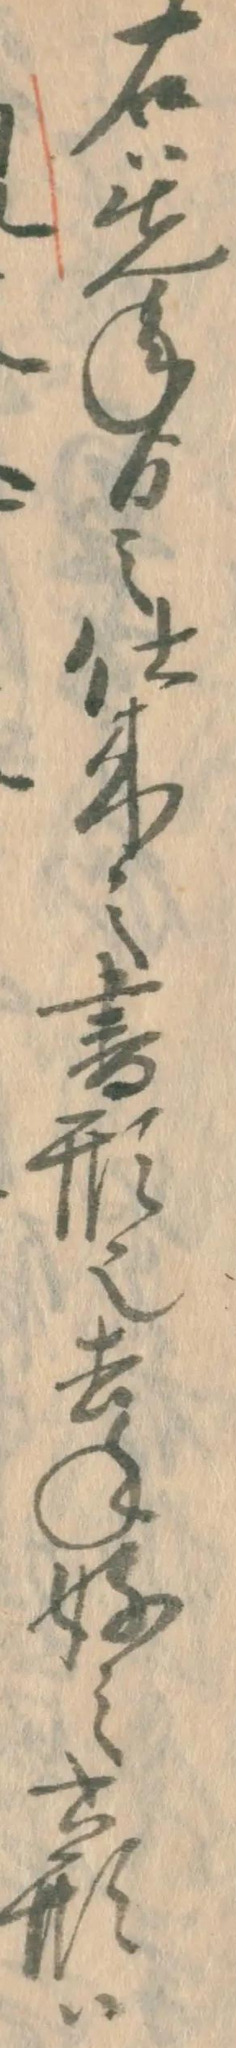右ハ先年ゟ之仕来之書形也去年好之書形ハ
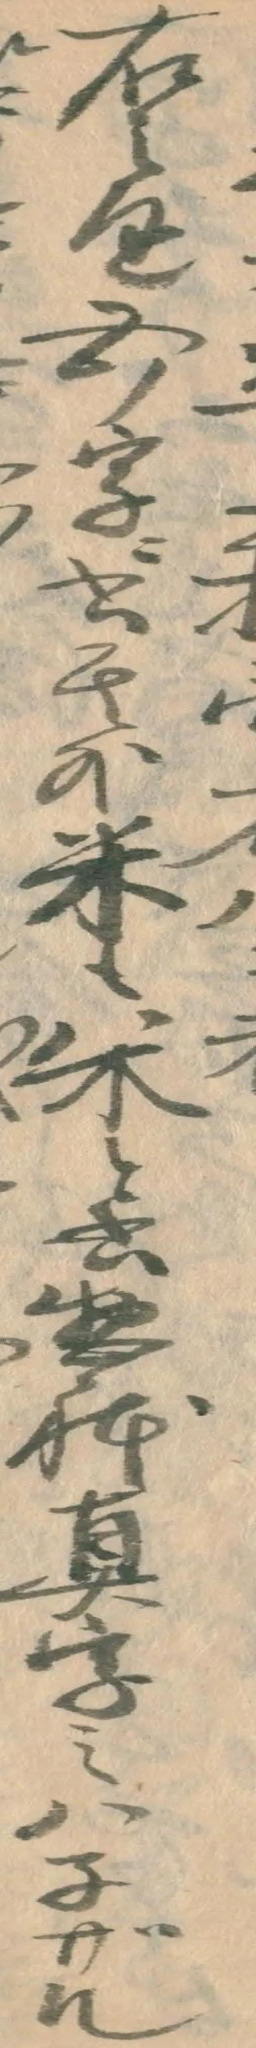右之通五ノ字ニ書其外米も八木と書惣体真字之ハネザル
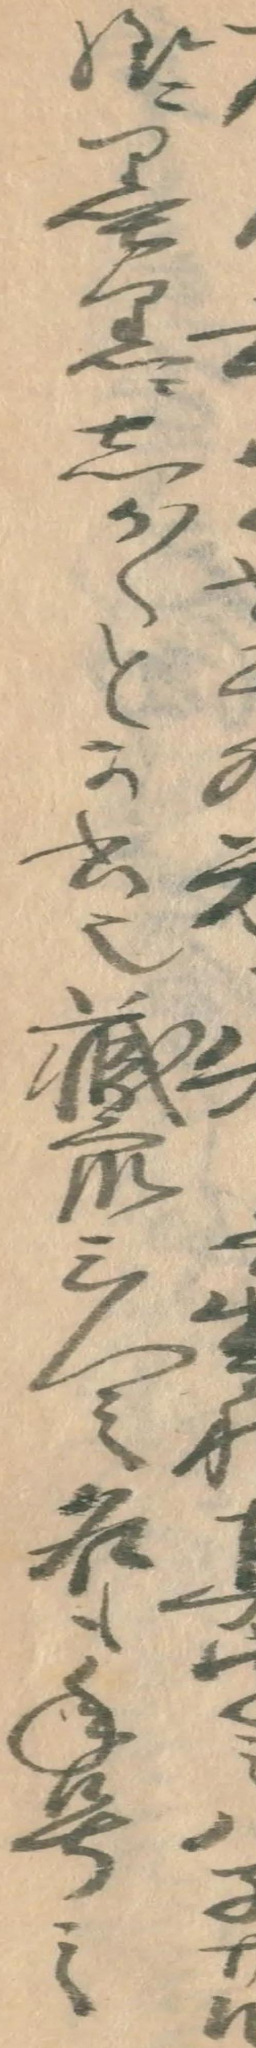様ニ墨黒ニしか〳〵と可書也蔵衆三人之名も年号之
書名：賀茂社記録. 第60冊
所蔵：国立国会図書館 National Diet Library, JAPAN
